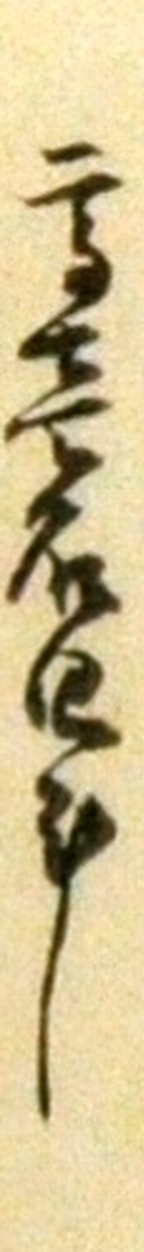高壱石四斗
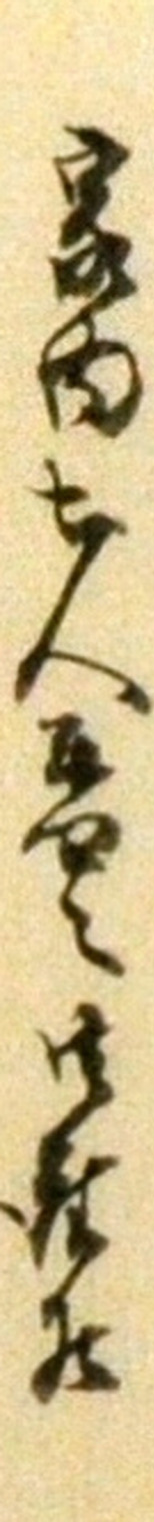家内七人暮し御座候
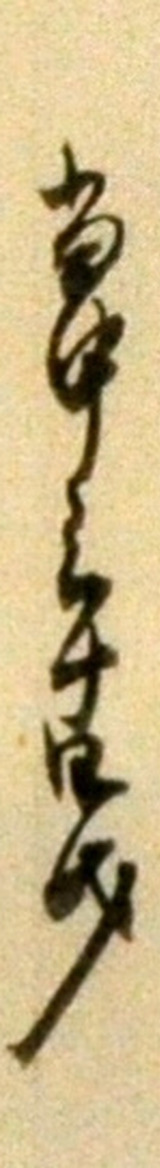当甲三十四才
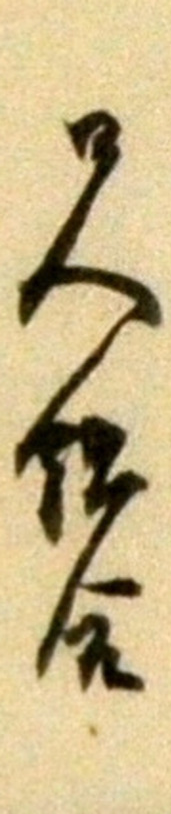同人組合
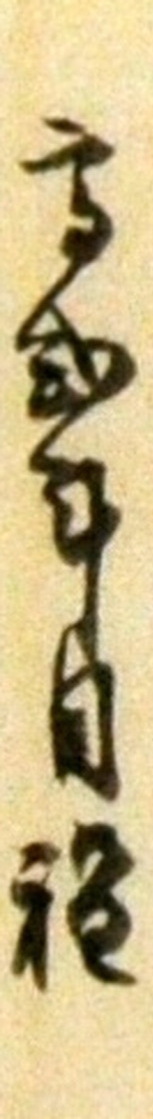高弐斗目禮
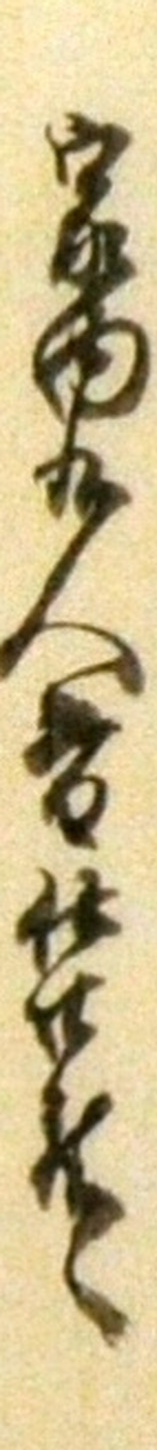家内九人暮仕御座候

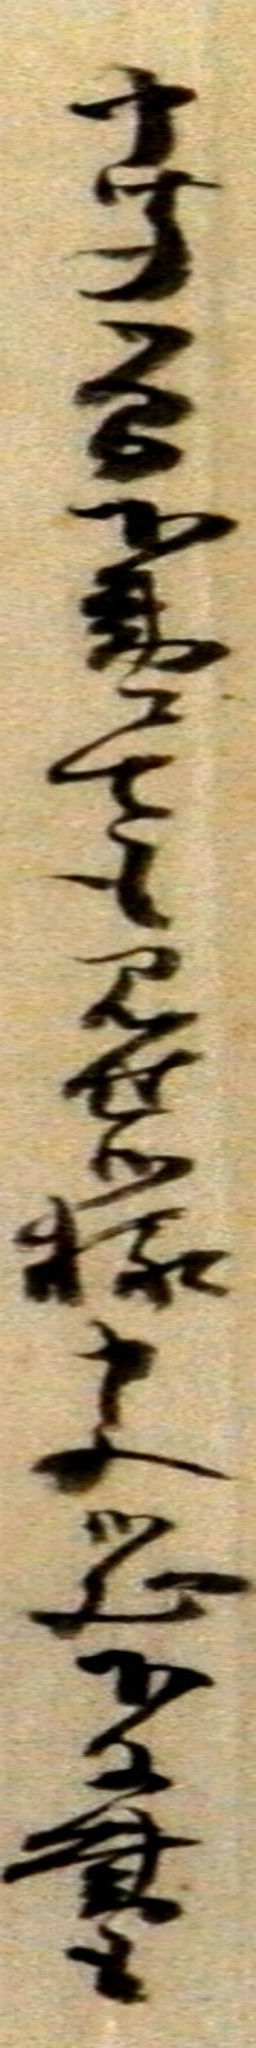申聞候間下乗二ても見せ候様申入候処下タ書も
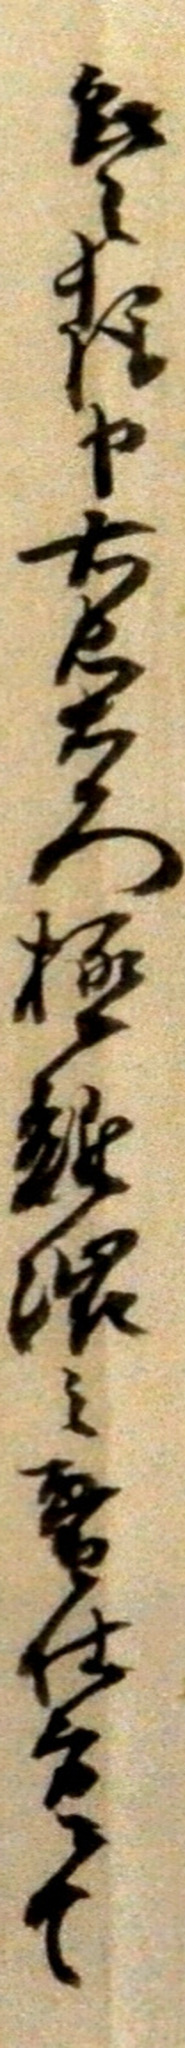無之趣申右忠右衛門極難渋之暮仕方二て
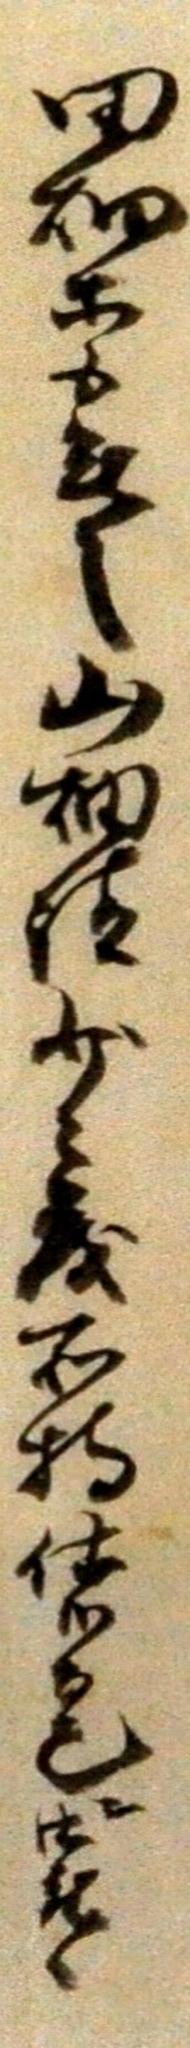田畑等も無之山畑僅少ニ茂所持仕候而巳ニ御座候
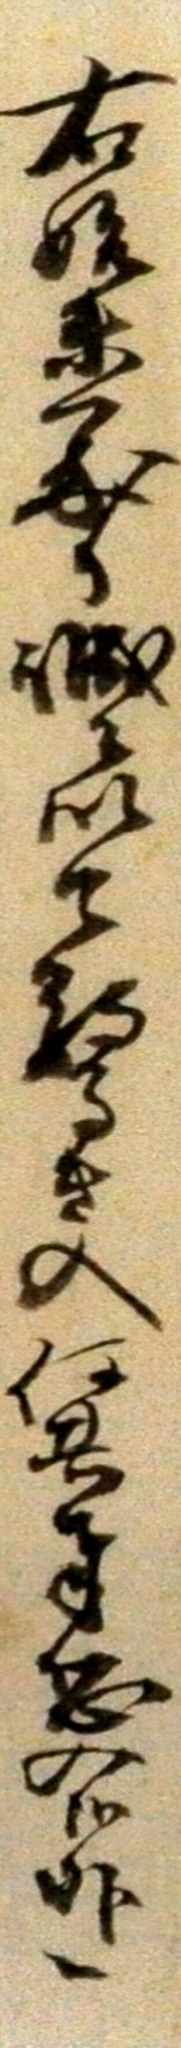右始末承り誠二以て驚き入何共奉恐入候外二
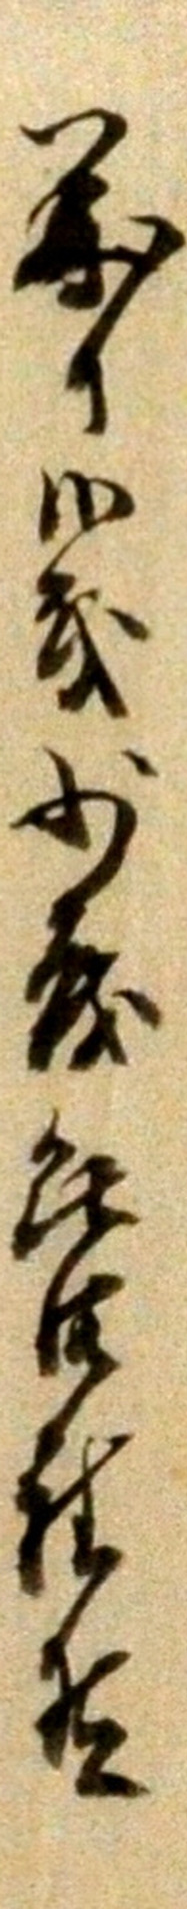承り候義少茂無御座候
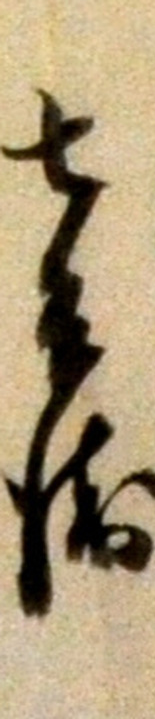七兵衛
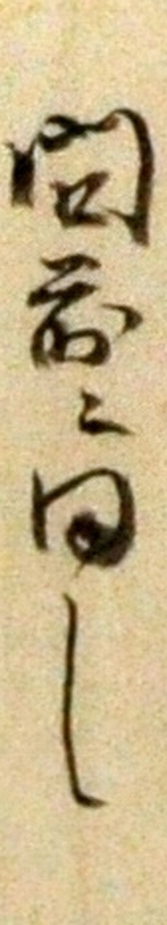問前二同じ
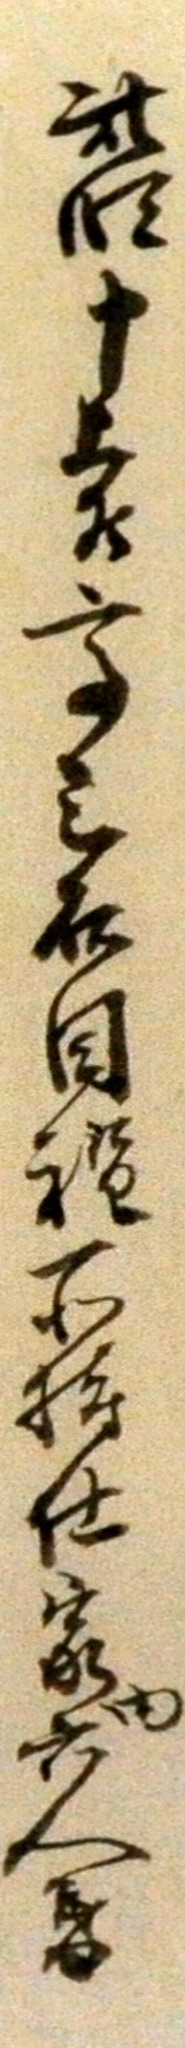此段申上候高三石目禮所持仕家内六人暮
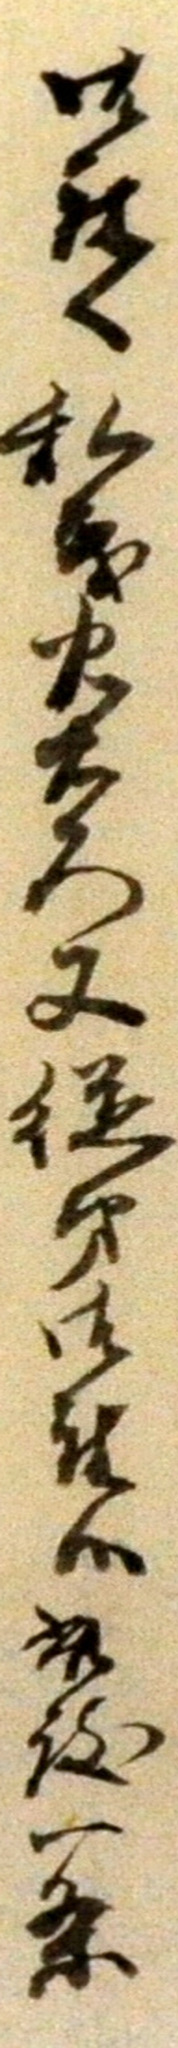御座候私義忠右衛門又従弟御座候此度一条
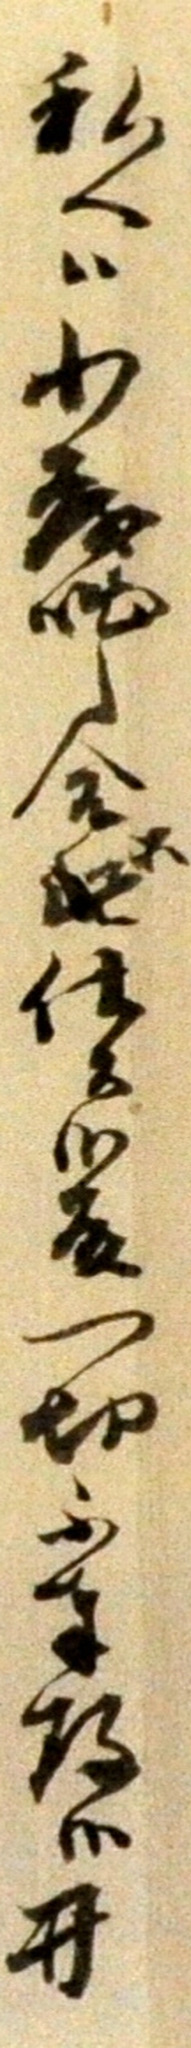私へハ少茂咄し全無仕方候故一切不奉存候井
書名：中沢村駕籠訴事件書類写
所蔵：伊那市立高遠町図書館・合同会社AMANE
